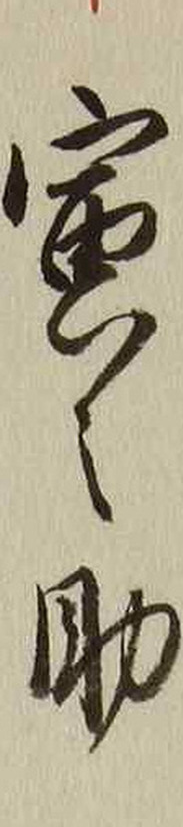寅之助
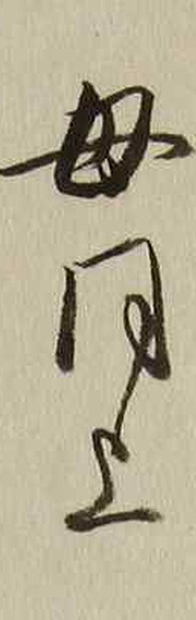母同上
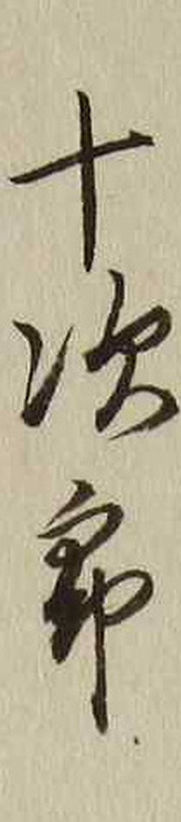十次郎
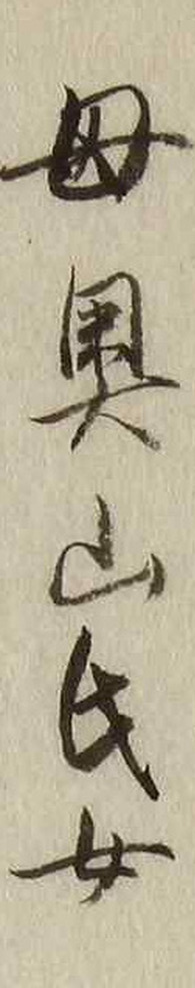母奥山氏女
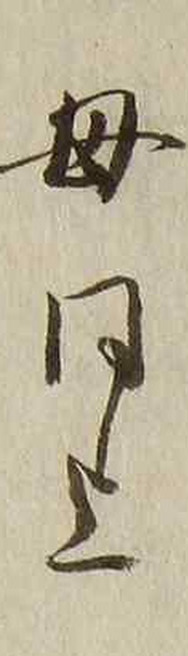母同上

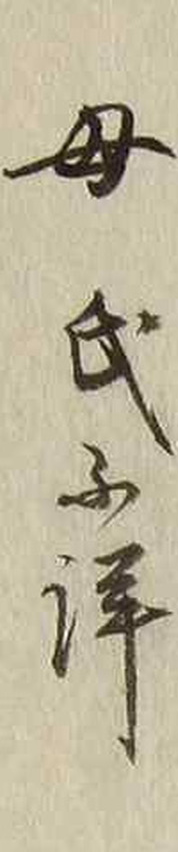母氏不詳
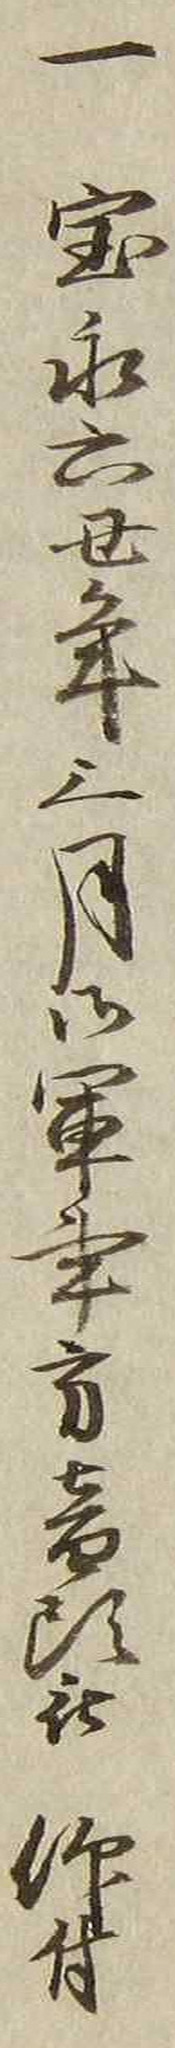一宝永六丑年三月御軍事方音頭被仰付

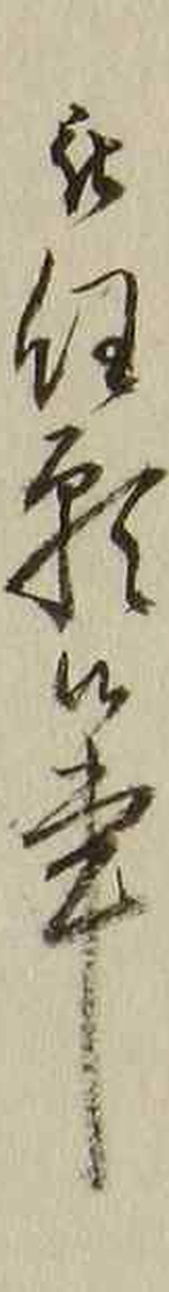被任願候事
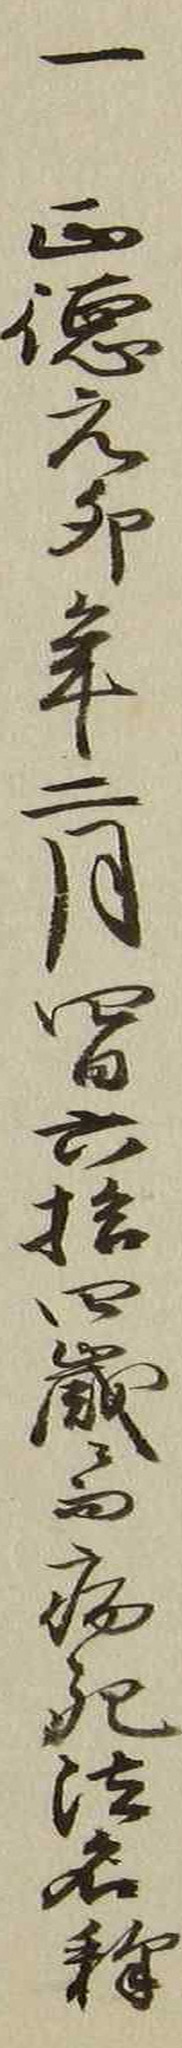一正徳元卯年月二月四日六拾四歳ニ而病死法名釈
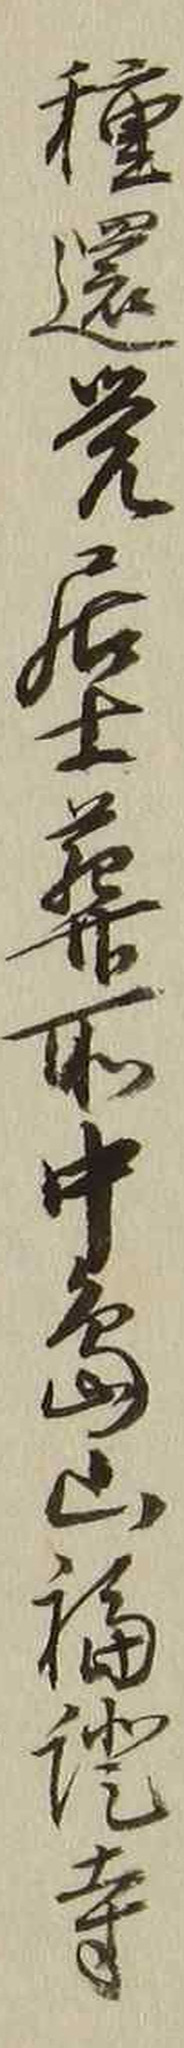種還覚居士葬所中島山福証寺
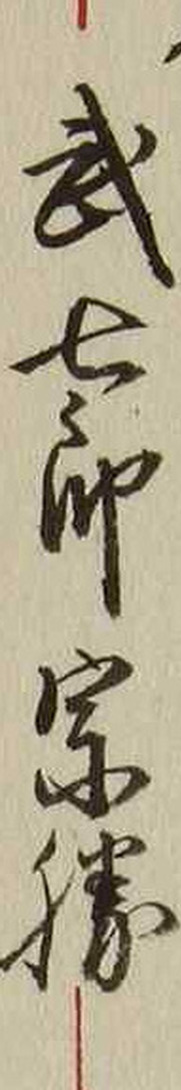武七郎宗勝
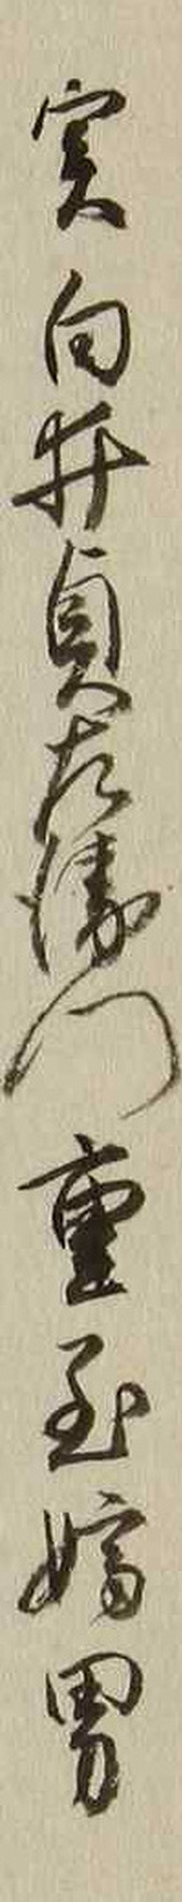実白井貞左衛門重至嫡男
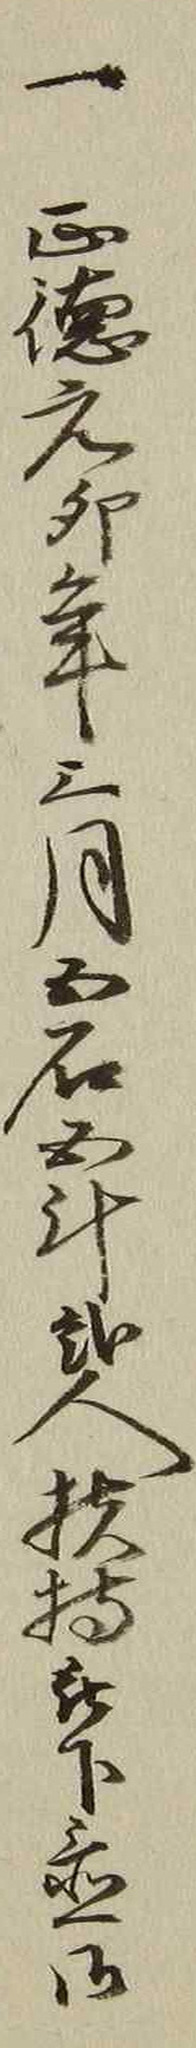一正徳元卯年三月五石五斗弐人扶持被下置御
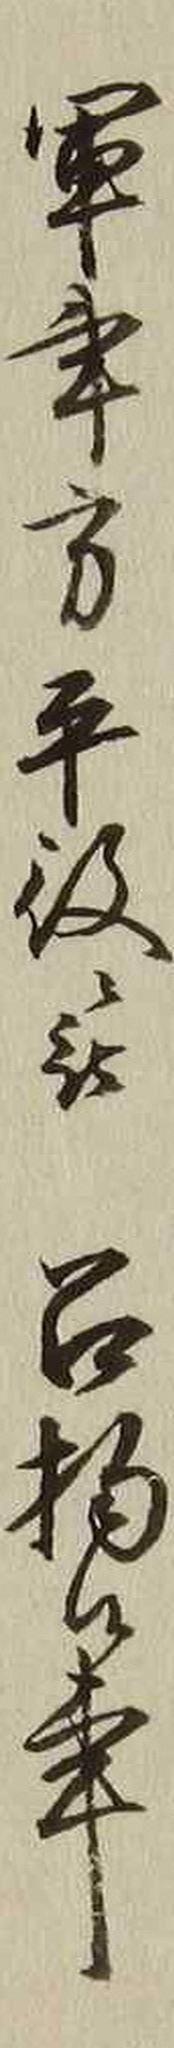軍事方平役ニ被召抱候事
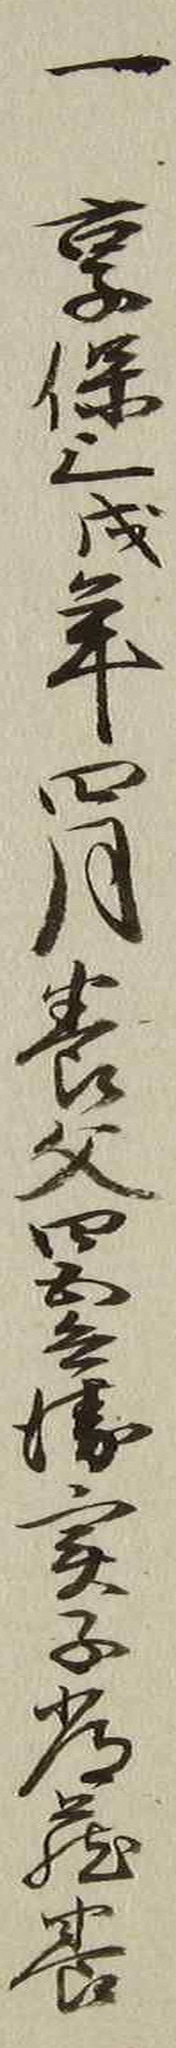一享保三戌年四月養父四五兵衛実子常蔵養
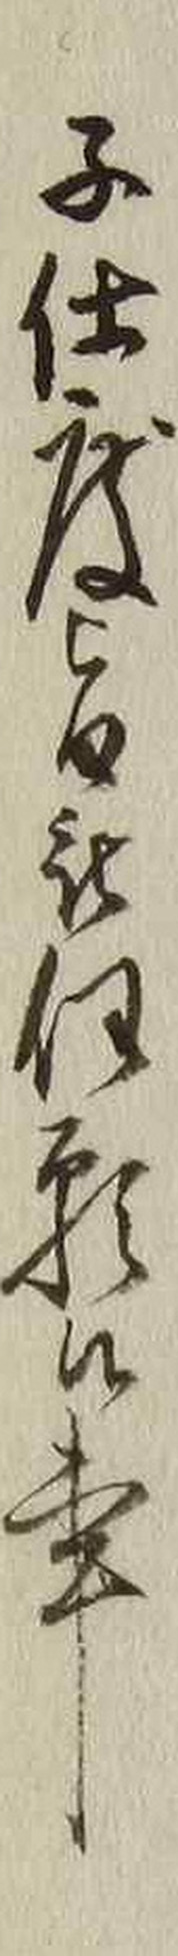子仕度旨被任願候事
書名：諸士系譜　巻之102　か之部10
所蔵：会津若松市立会津図書館
